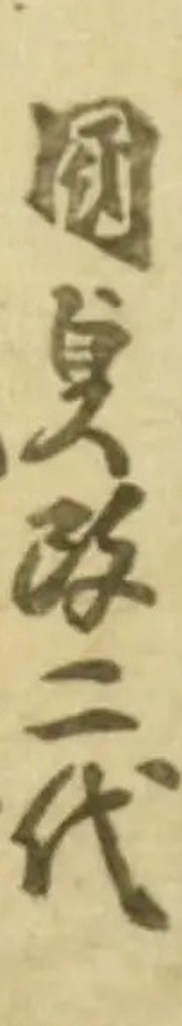国貞改二代
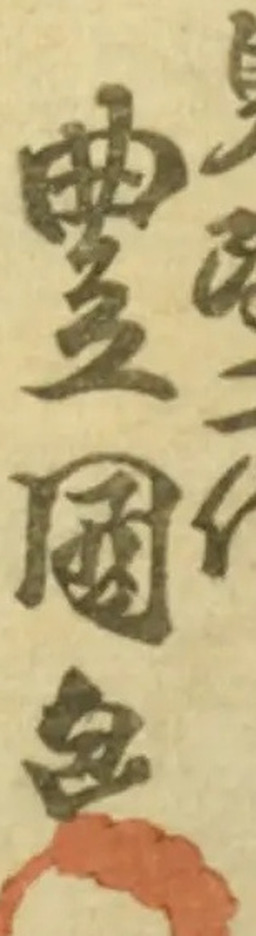豊国画
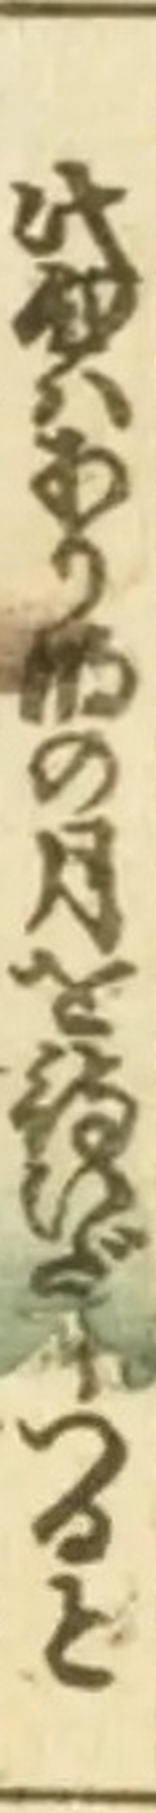此心はあり明の月を待いだしつると
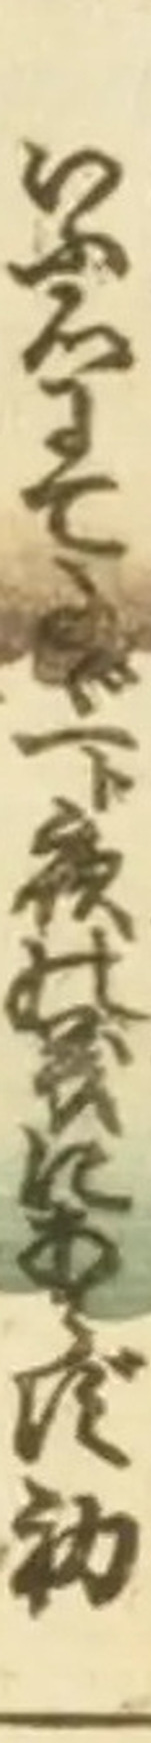いふ心にてたゞ一ト夜の義にあらず初
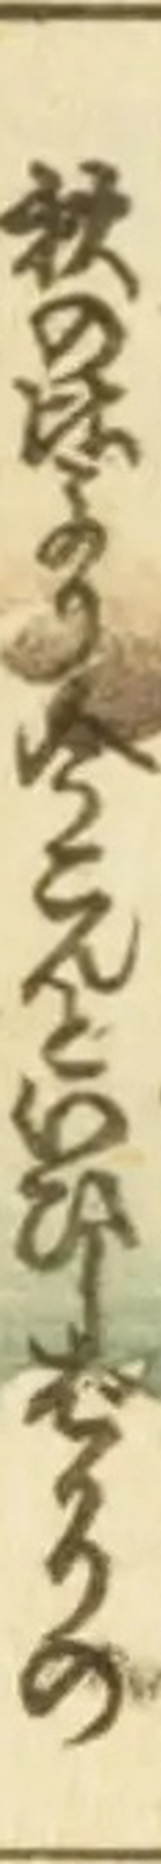秋の比より今こんといひしばかりの
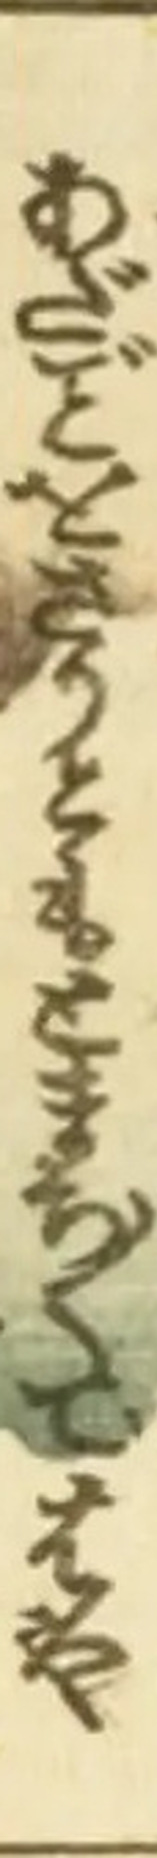あだごとをさりともとまち〳〵てはや
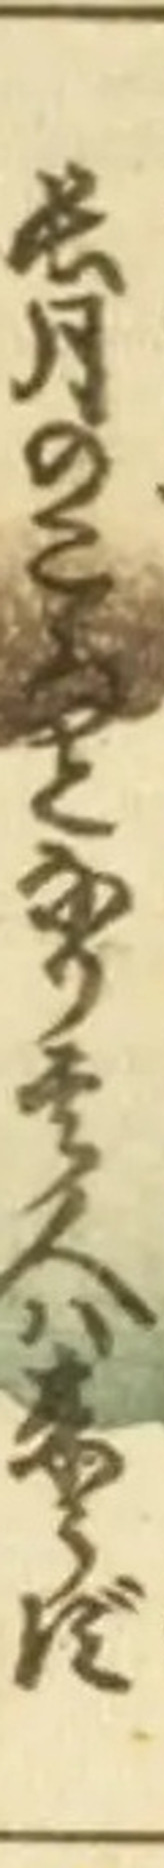長月のころとなり其人は来らず
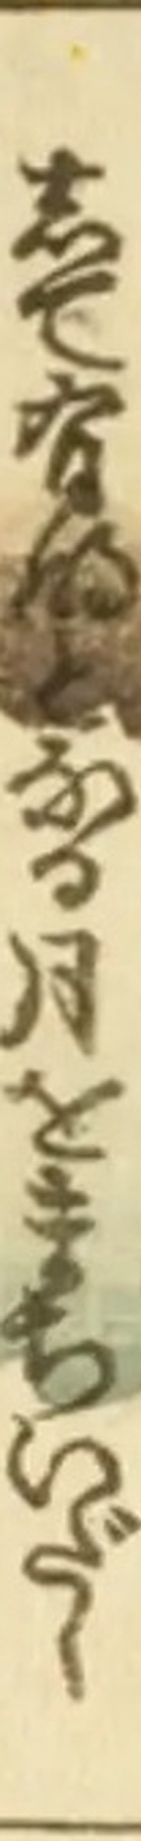して有明となる月をまちいだし
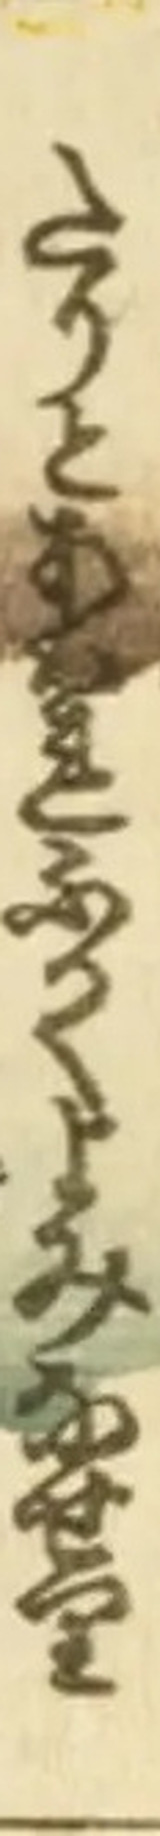たりとあはれふかくよみなせり
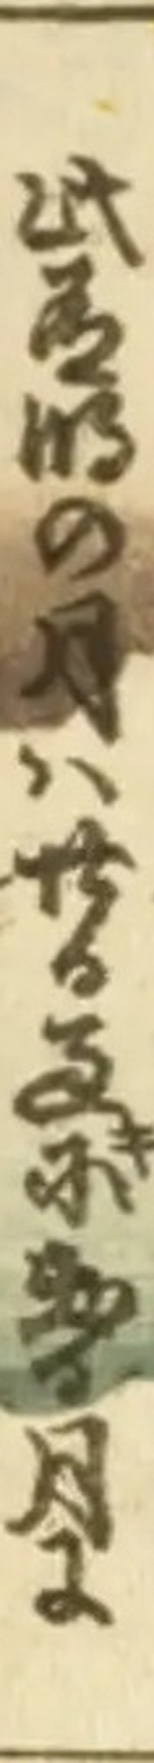此有明の月は廿日過きに出る月に
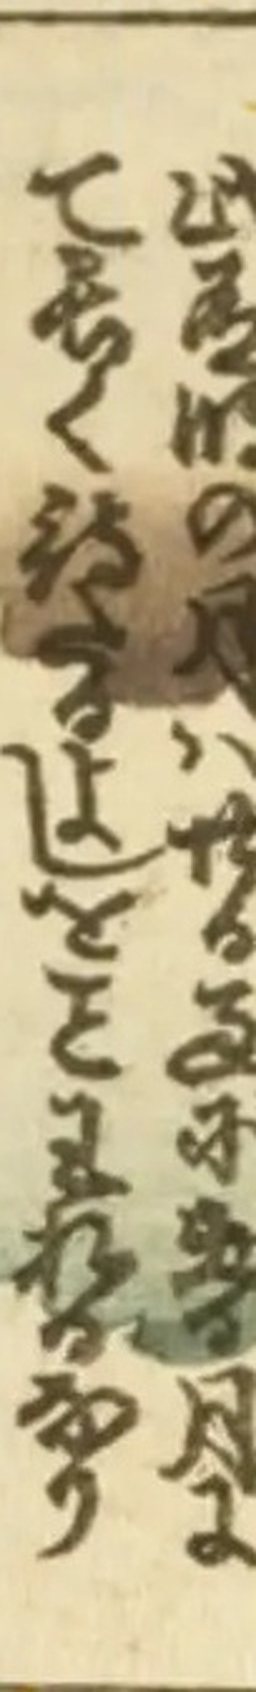て長く待たるよしをことわれるなり
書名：百人一首絵抄　廿一　素性法師
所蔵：国立国会図書館 National Diet Library, JAPAN
